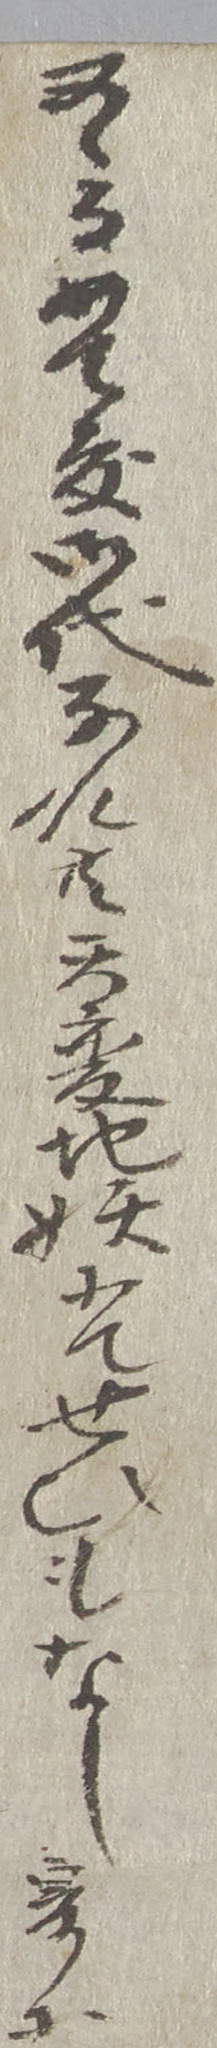かゝるめで度御代なれ共天変地妖にてせひもなし爰に
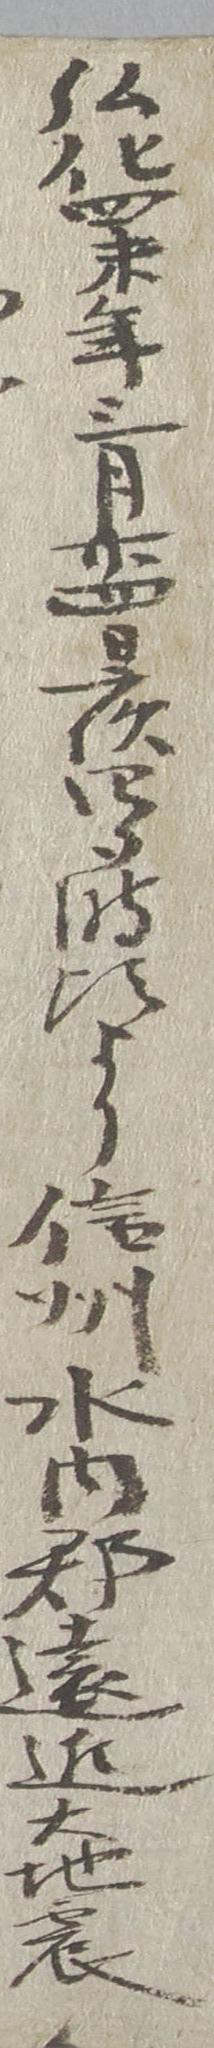弘化四未年三月廿四日夜四ツ時頃より信州水内郡遠近大地震
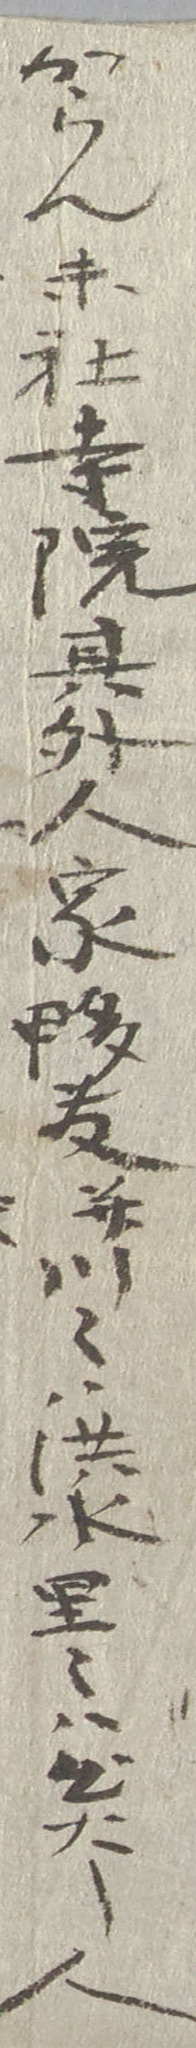からん末社寺院其外人家夥敷幷川々ハ洪水里々ハ出火し人
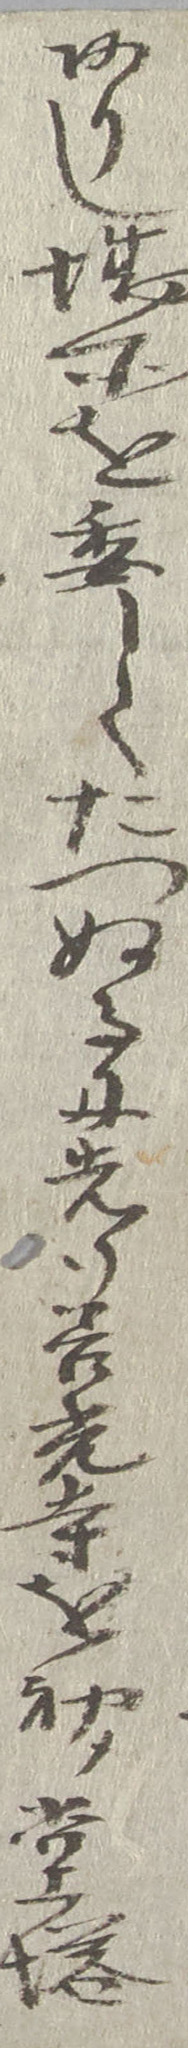阿りし場所を委しくたつぬるに先ツ善光寺を初メ堂塔
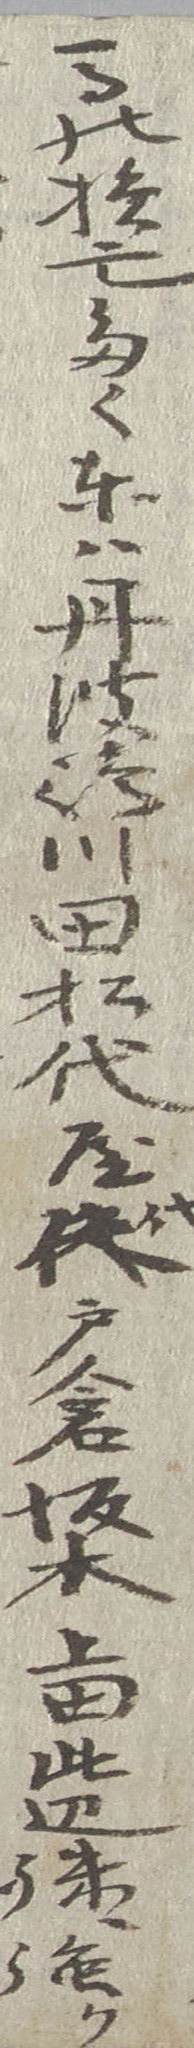馬の損亡多く東ハ丹波嶋川田松代屋代戸倉坂木上田此辺殊ニ強ク
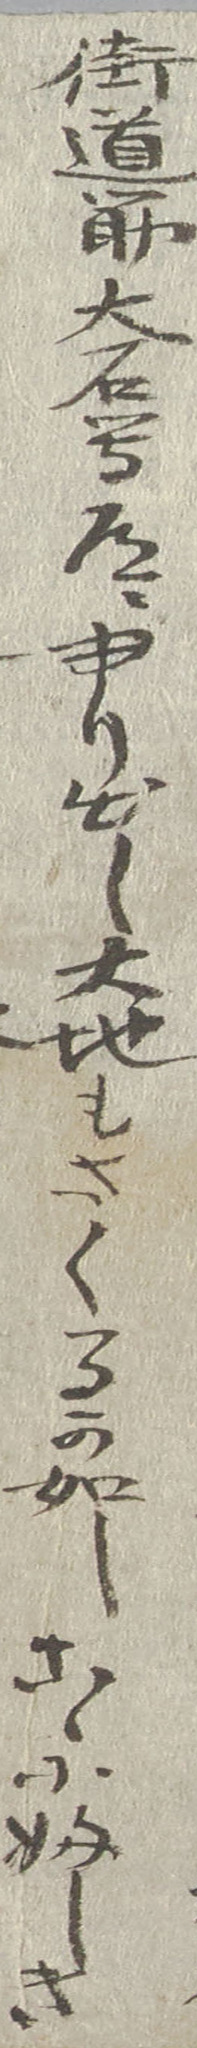街道筋大石等道ニゆり出し大地もさくるか如しこゝにふしき
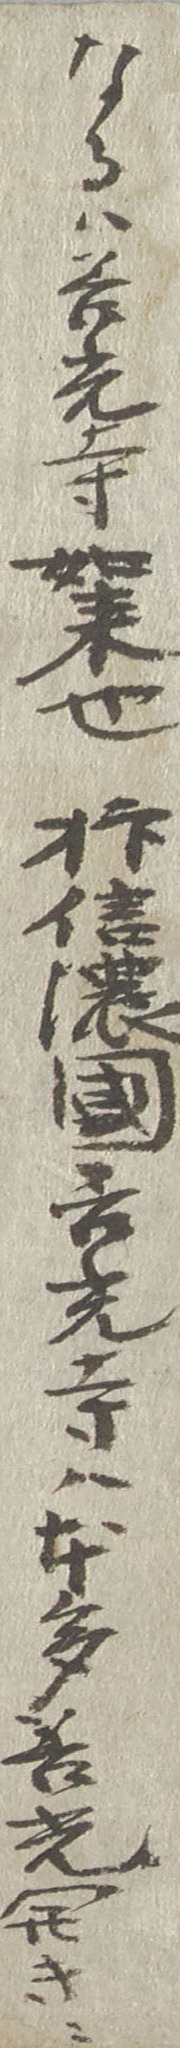なるハ善光寺如来也抑信濃國善光寺ハ本多善光開きニ
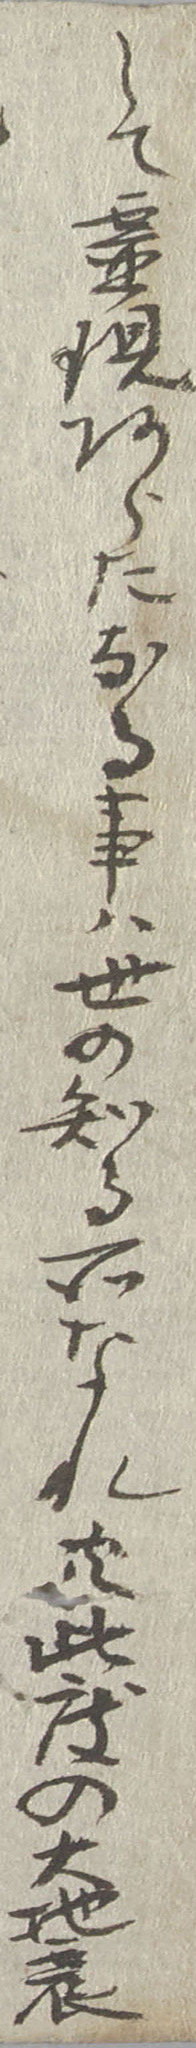して霊現あらたかなる事ハ世の知る所なれ共此度の大地震
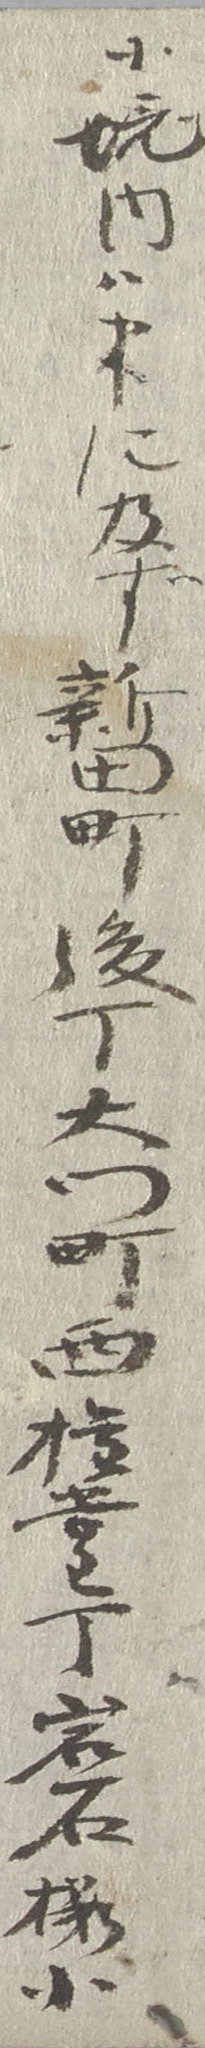に境内ハ申に及ず新田町後丁大門町西権堂丁岩石桜小
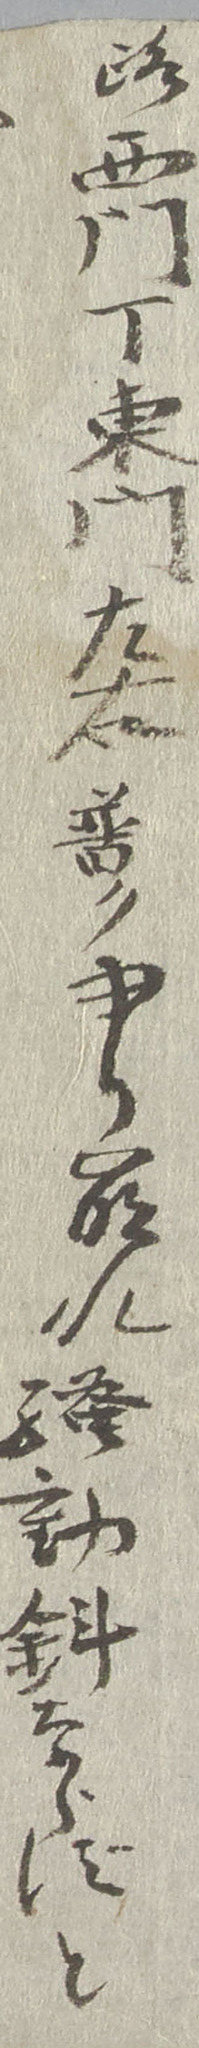路西門丁東門左右普クゆり崩れ騒動斜ならずと
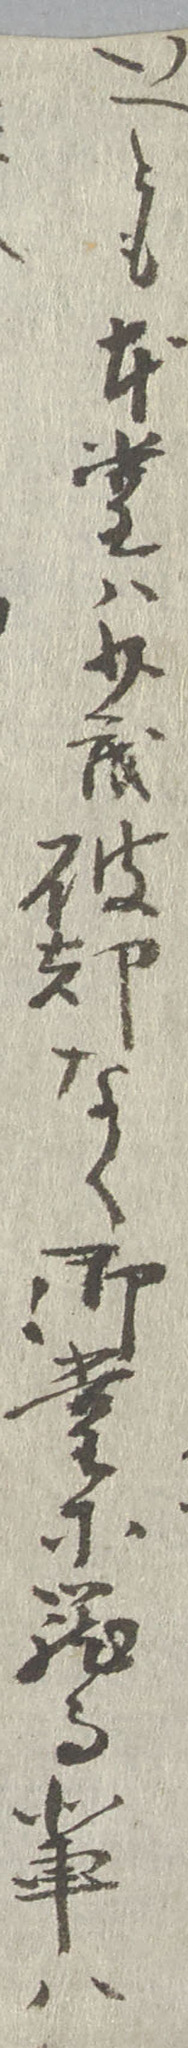いへとも本堂ハ少も破却なく御堂に籠る輩ハ
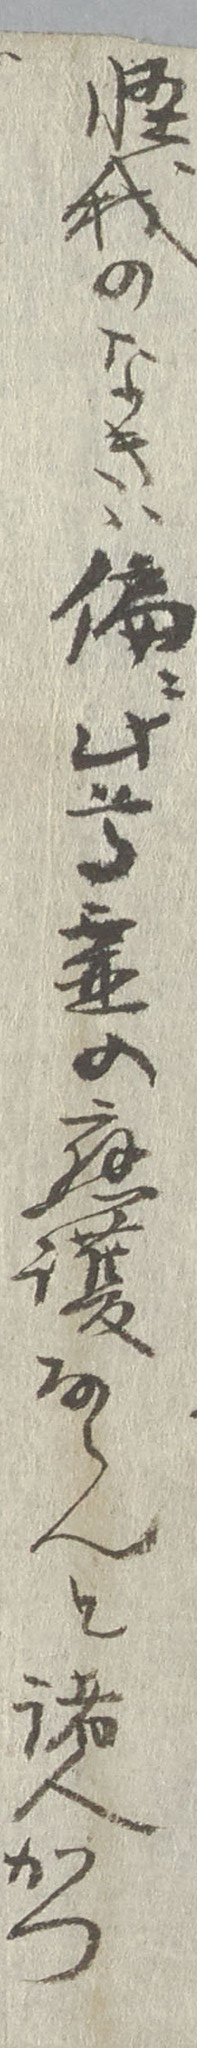怪我のなきハ偏ニ此尊霊の應護ならんと諸人かつ
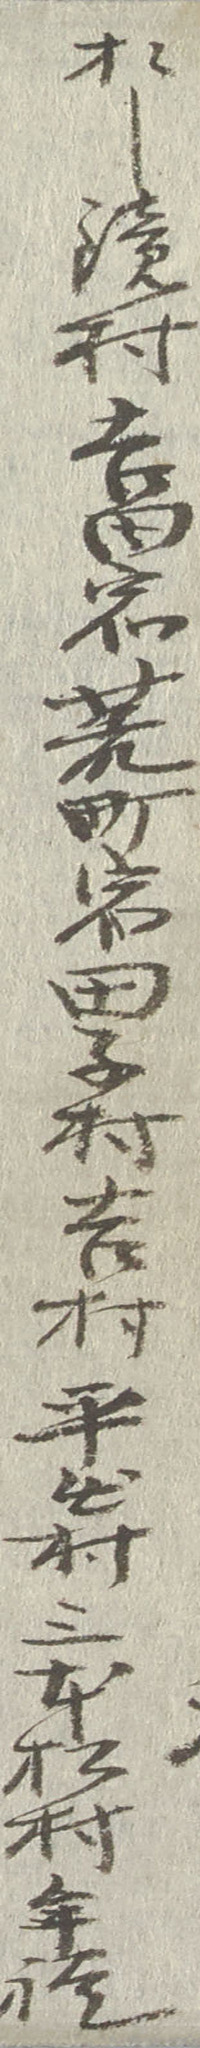おし鏡村吉田宿荒町宿田子村吉村平出村三本松村牟禮
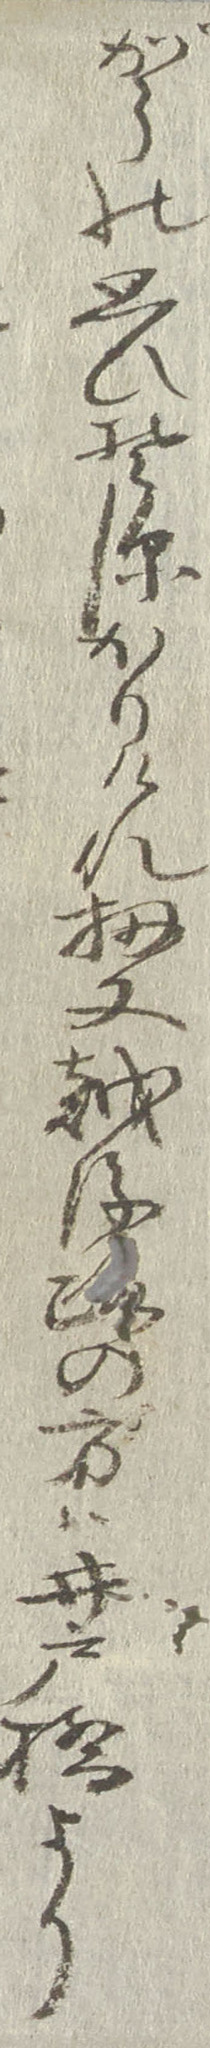がうの思ひそ深かりけれ扨又越後路の方ハ井戸橋より
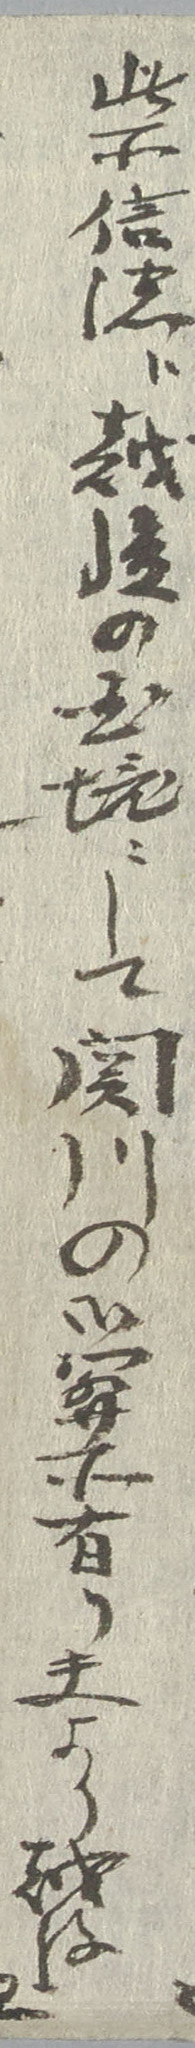此所信濃ト越後の国境にして関川の御関所有リ夫より越後国
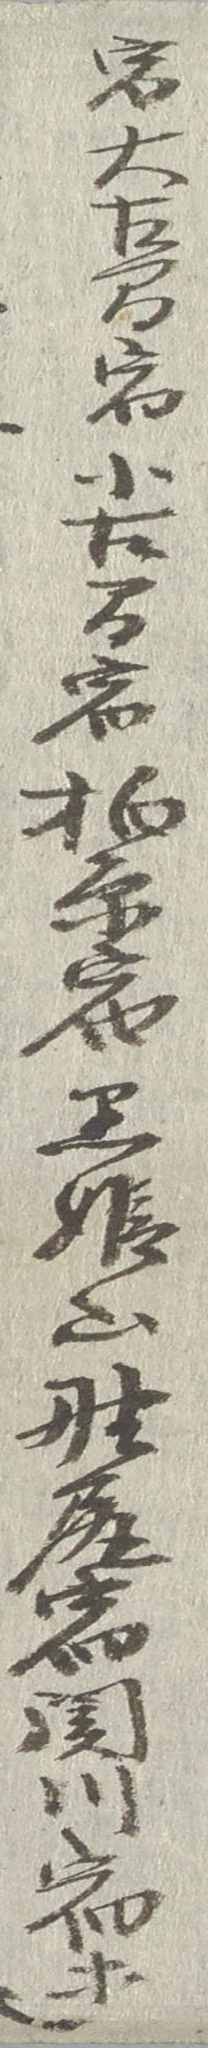宿大古間宿小古間宿柏原宿黒姫山野尻宿関川宿等也
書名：[善光寺地震摺物写]
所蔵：東京大学総合図書館 General Library in the University of Tokyo, JAPAN
